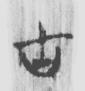古
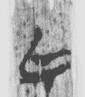㠯（以）
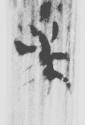求
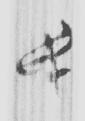民
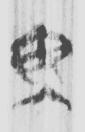安
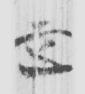正
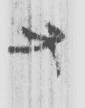又
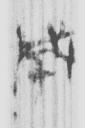成
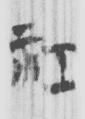{示工}
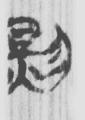則
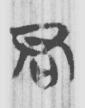君
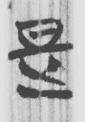是
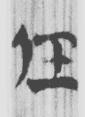任
